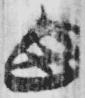西
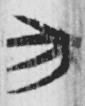方
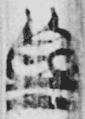爲
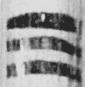三
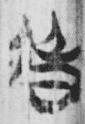俈
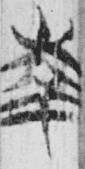南
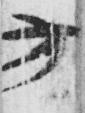方
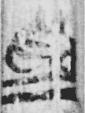爲
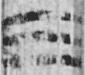三
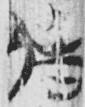俈
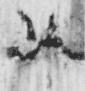北
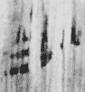方
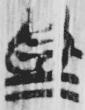爲
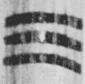三
